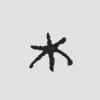木
